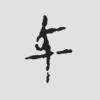牙
